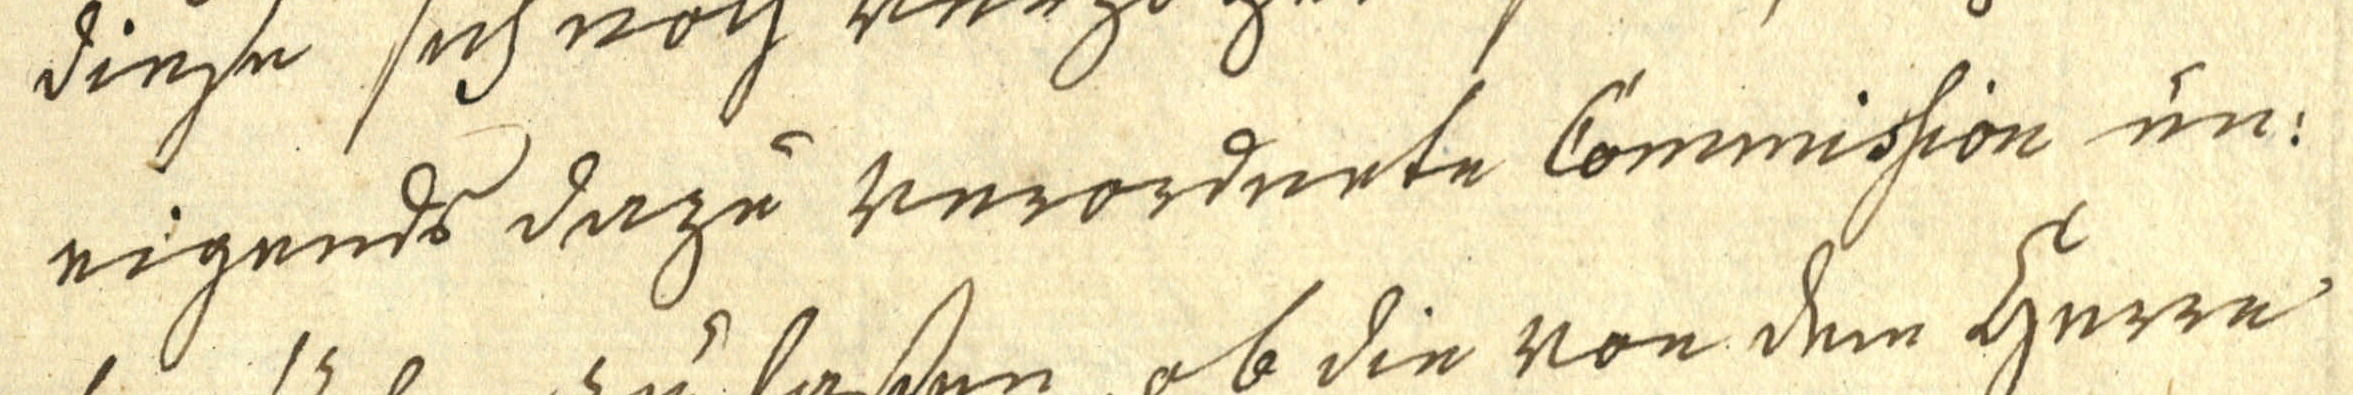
eigends dazu verordnete Commission un¬
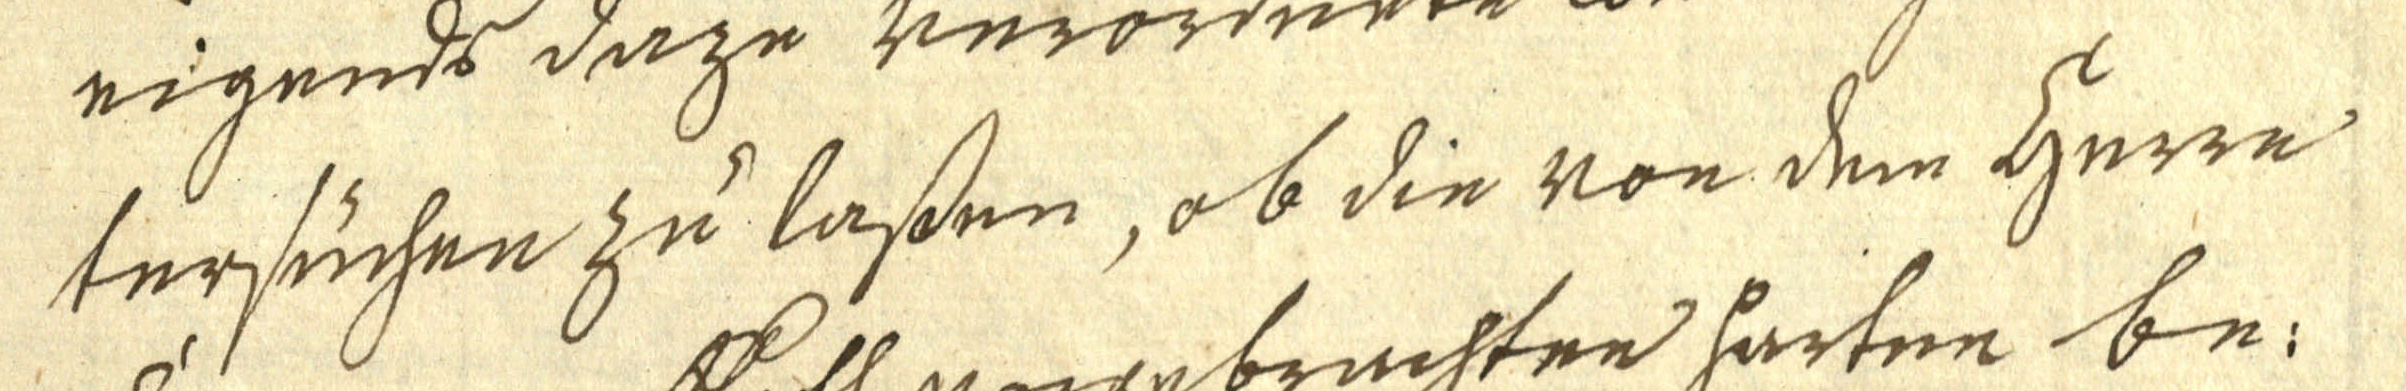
tersuchen zu laßen, ob die von dem Herrn
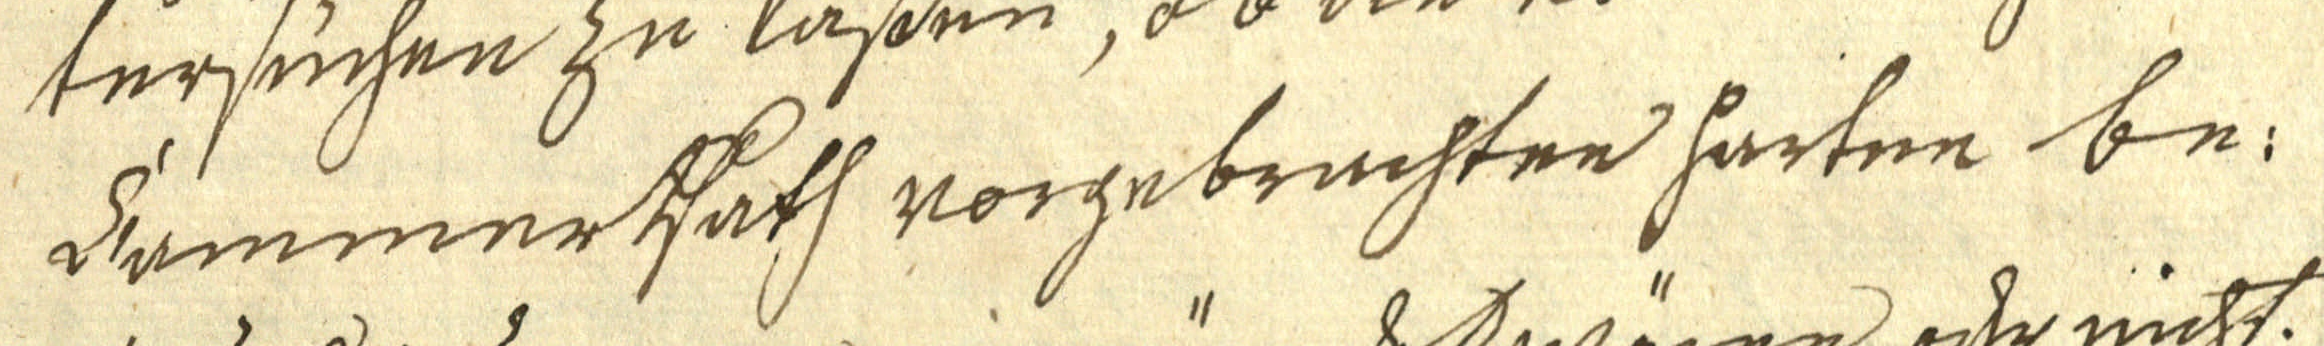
CammerRath vorgebrachten harten Be¬
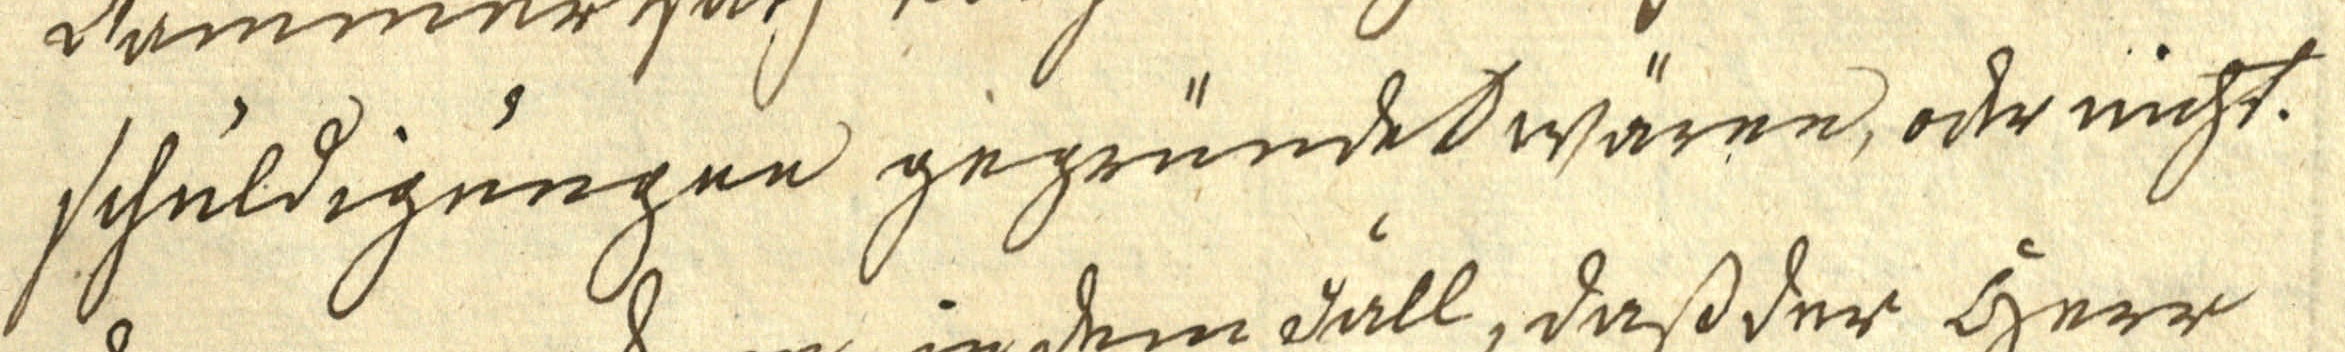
schuldigungen gegründet wären, oder nicht.
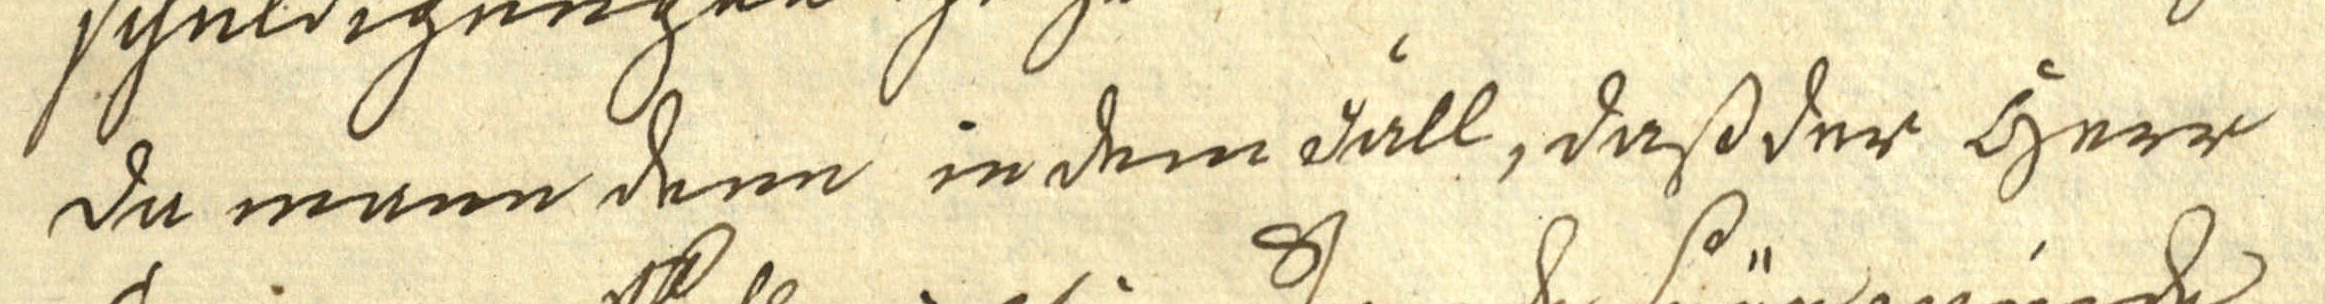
Da mann denn in dem Fall, daß der Herr
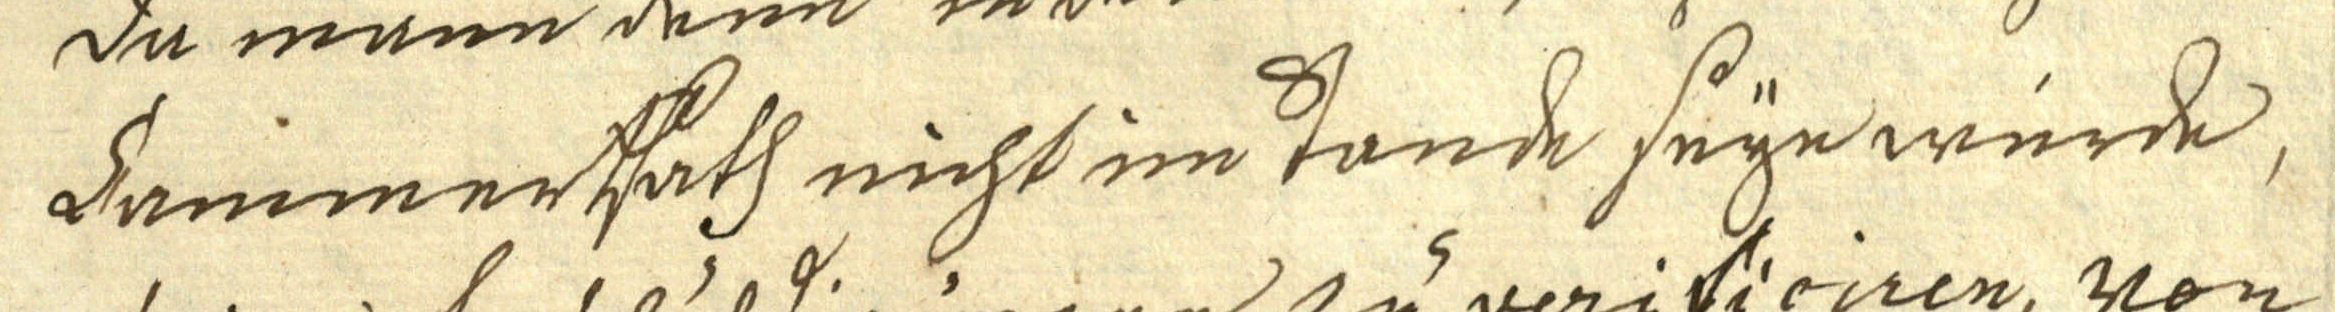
CammerRath nicht im Lande seÿn würde,
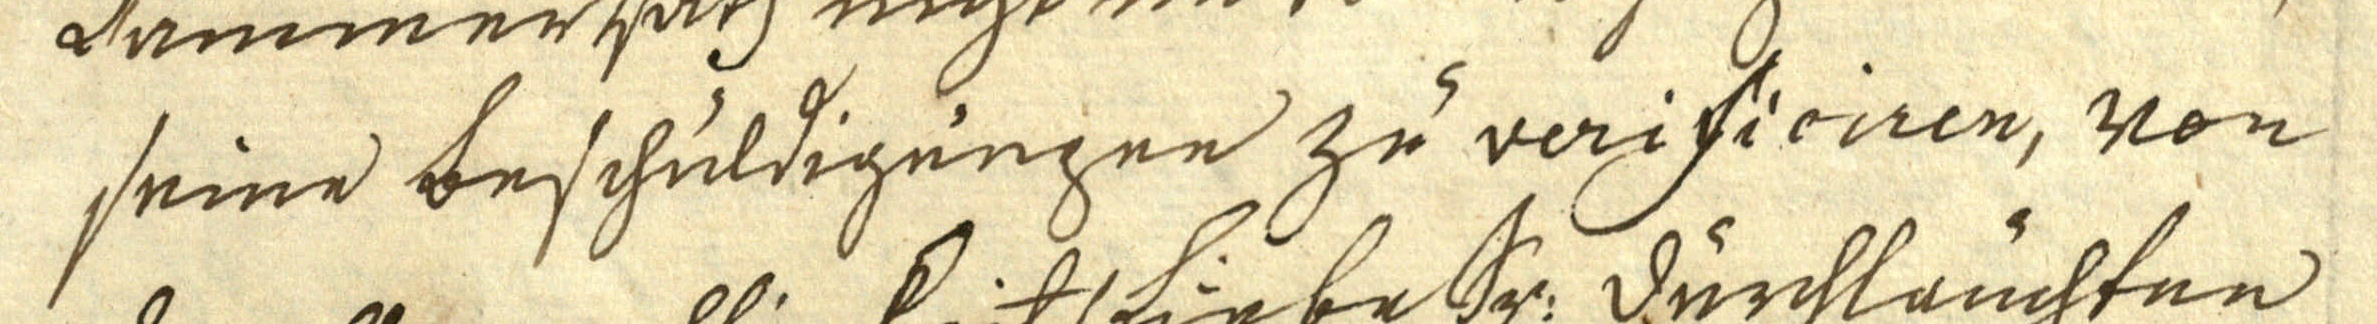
seine Beschuldigungen zu verificiren, von
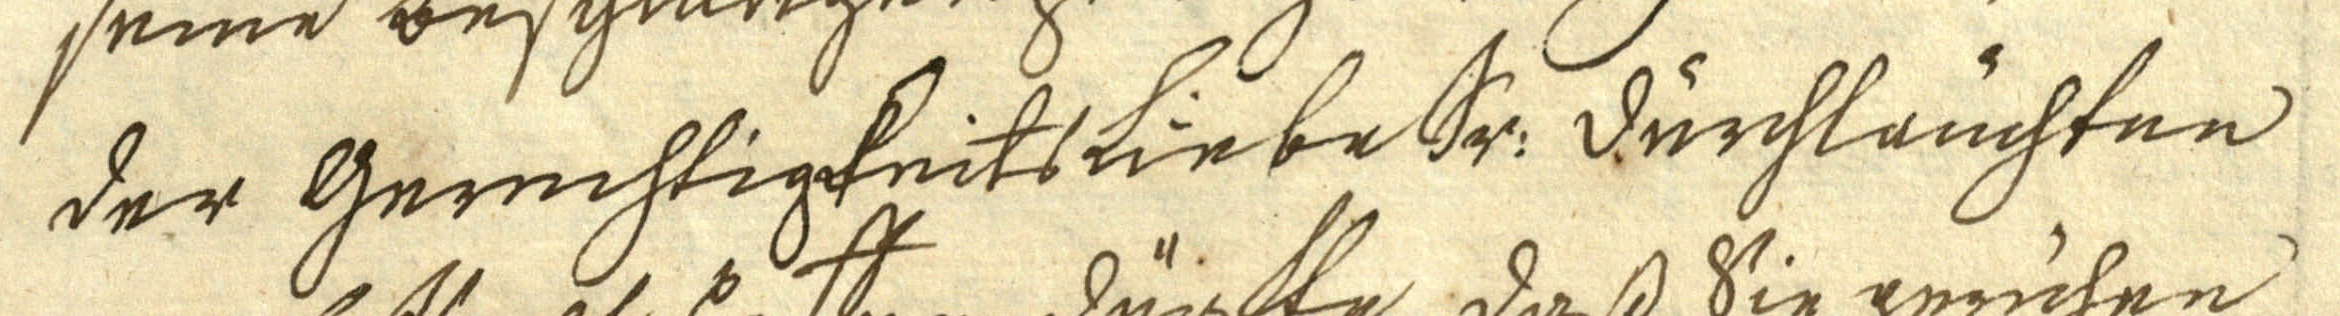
der Gerechtigkeits Liebe Sr Durchlauchten
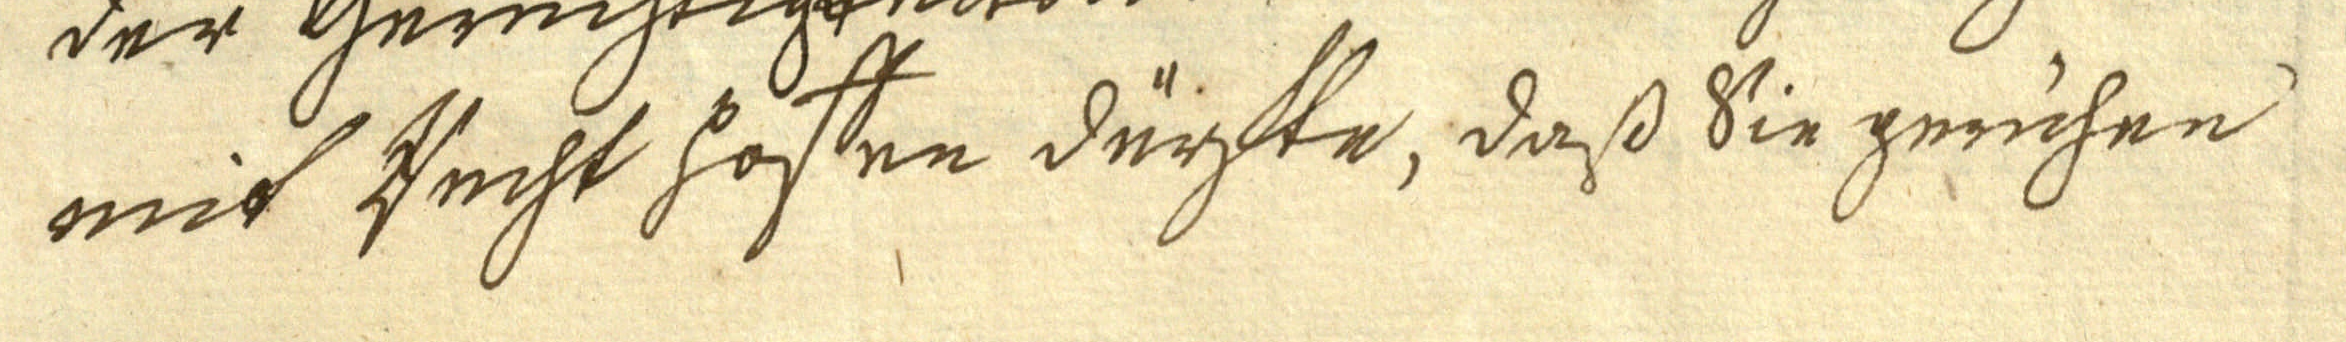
mit Recht hoffen dürfte, daß Sie geruhen
